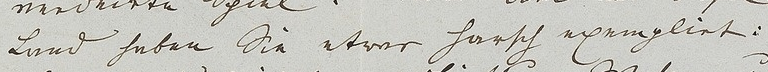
Land haben Sie etwas harsch exemplirt:
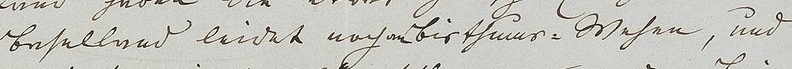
Baselland leidet noch an Bisthums-Wehen, und
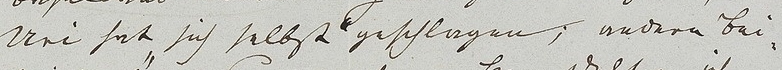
Uri hat sich selbst geschlagen; andere Bei-
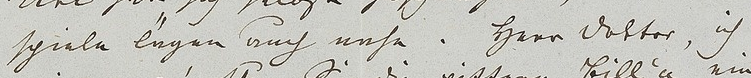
spiele lägen auch nahe. Herr Doktor, ich
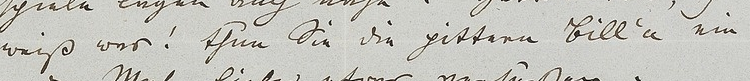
weiß was! thun Sie die pittern Bill'n ein
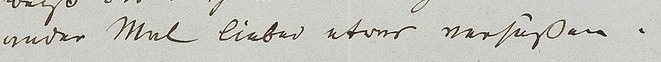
ander Mal lieber etwas versüßen.
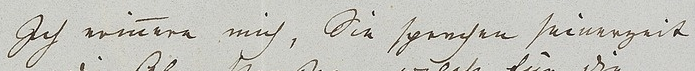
Ich erinnere mich, Sie sprachen seinerzeit
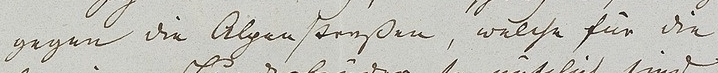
gegen die Alpenstraßen, welche für die
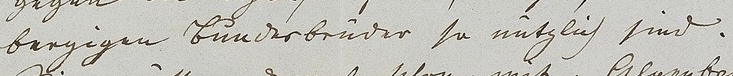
bergigen Bundesbrüder so nützlich sind.
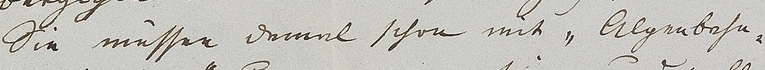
Sie müssen damal schon mit «Alpenbahn-
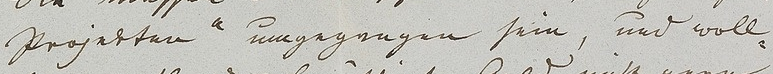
Projekten» umgegangen sein, und woll-
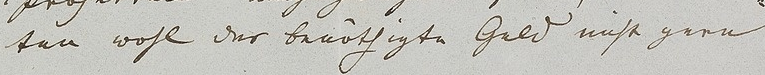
ten wohl das benöthigte Geld nicht gern
